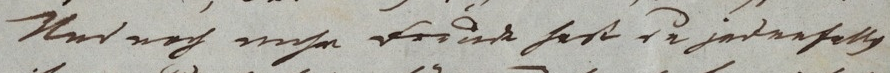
Und noch mehr Freude hast Du jedenfalls
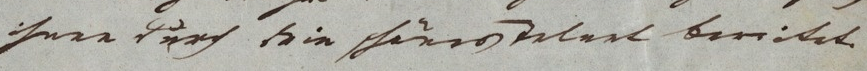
ihnen durch Dein schönes Talent bereitet.
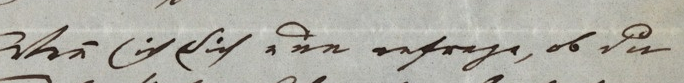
Wenn ich Dich nun anfrage, ob Du
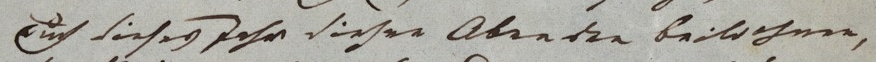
auch dieses Jahr diesen Abenden beiwohnen,
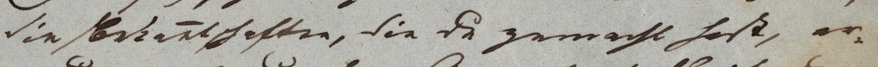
die Bekanntschaften, die Du gemacht hast, er-
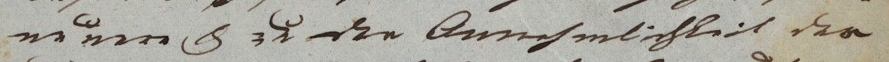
neuern & zu der Annehmlichkeit des
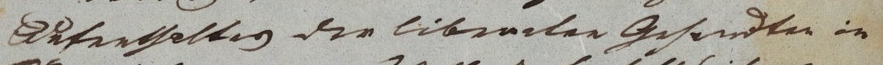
Aufenthaltes der liberalen Gesandten in
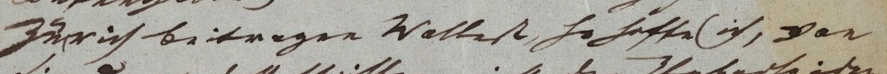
Zürich beitragen wollest, so hoffe ich, von
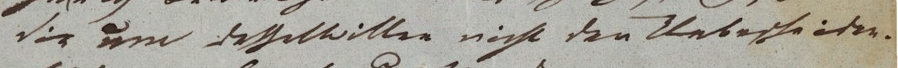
Dir um dessetwillen nicht der Unbescheiden-
